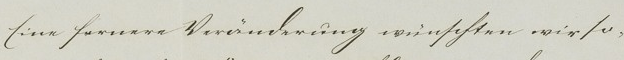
Eine fernere Veränderung wünschten wir so-
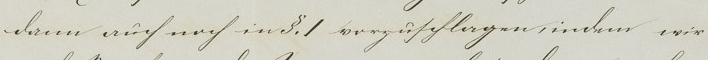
dann auch noch in §.1 vorzuschlagen, indem wir
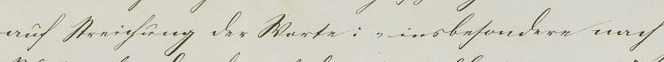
auf Streichung der Worte: «insbesondere nach
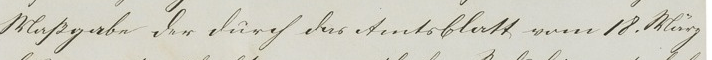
Maßgabe der durch das Amtsblatt vom 18. März
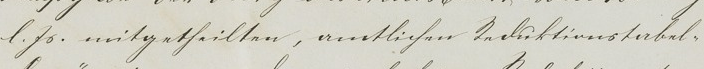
l. Js. mitgetheilten, amtlichen Reduktionstabel-
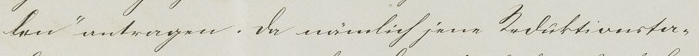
len» antragen. Da nämlich jene Reduktionsta-
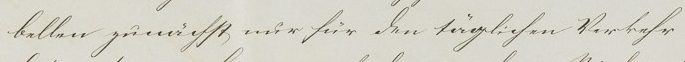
bellen zunächst nur für den täglichen Verkehr
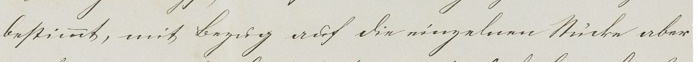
bestimmt, mit Bezug auf die einzelnen Stücke aber
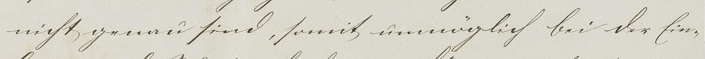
nicht genau sind, somit unmöglich bei der Ein-
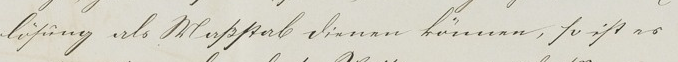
lösung als Maßstab dienen können, so ist es
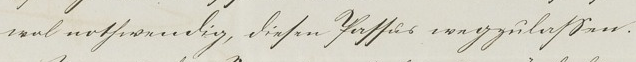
wol nothwendig, diesen Passus wegzulassen.
